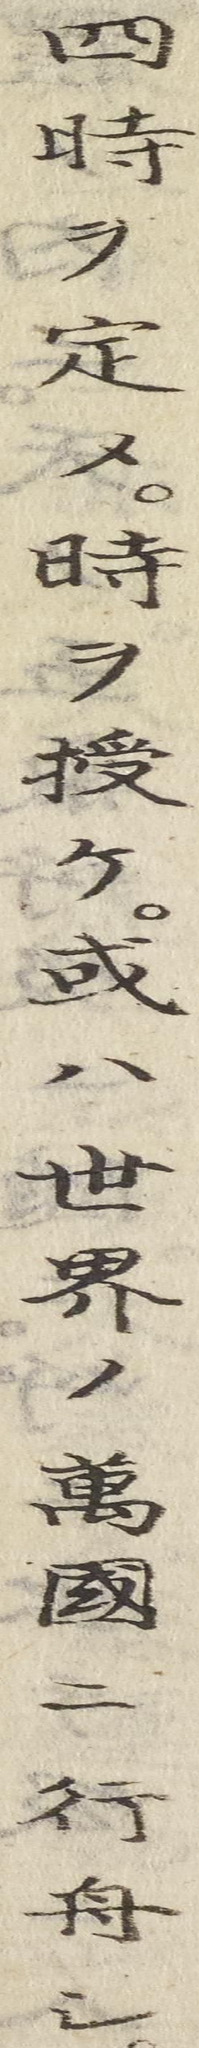四時ヲ定メ。時ヲ授ケ。或ハ世界ノ万国ニ行舟シ。
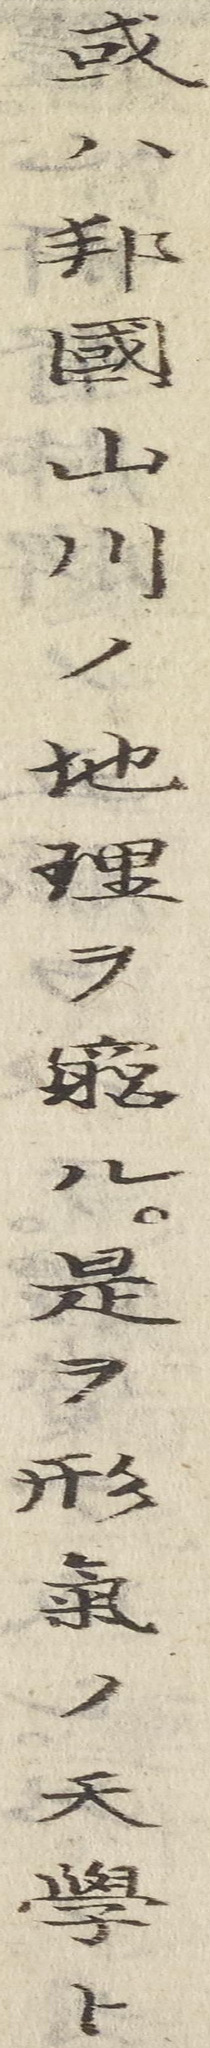或ハ邦国山川ノ地理ヲ窮ル。是ヲ形気ノ天学ト
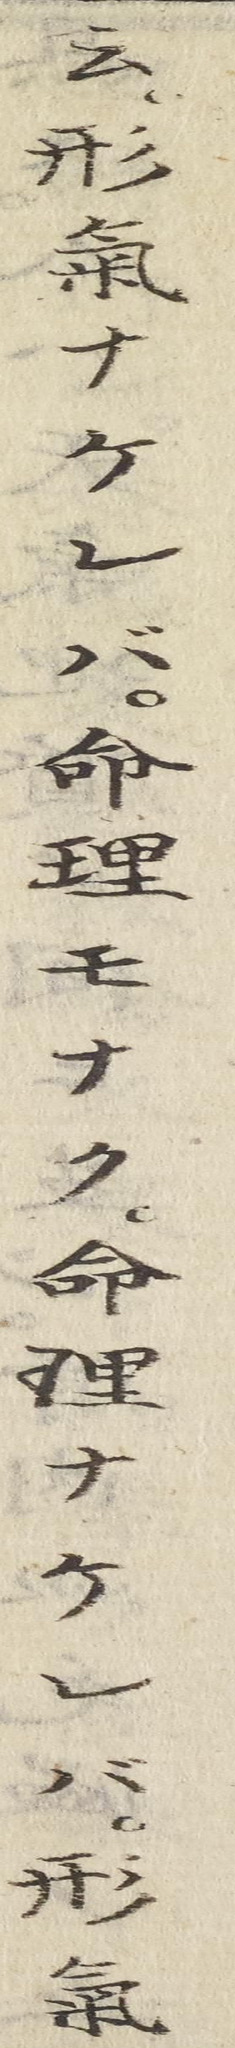云。形気ナケレバ。命理モナク。命理ナケレバ。形気
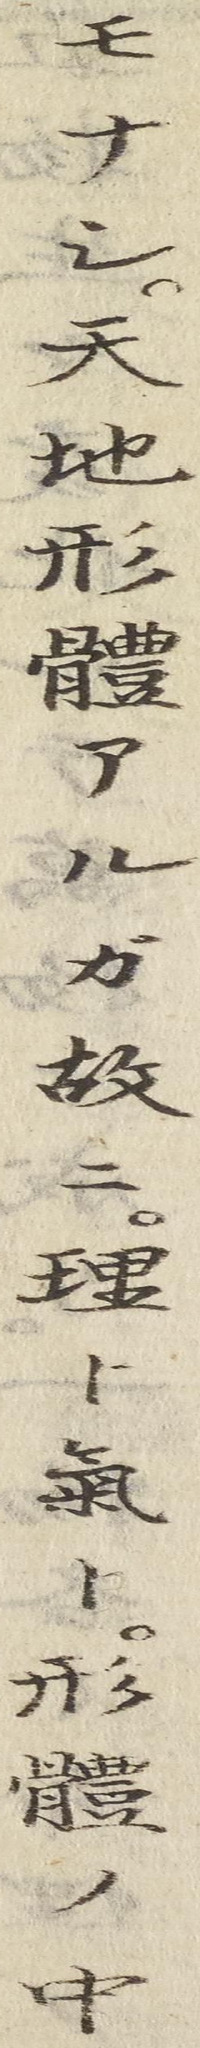モナシ。天地形体アルガ故ニ。理ト気ト。形体ノ中
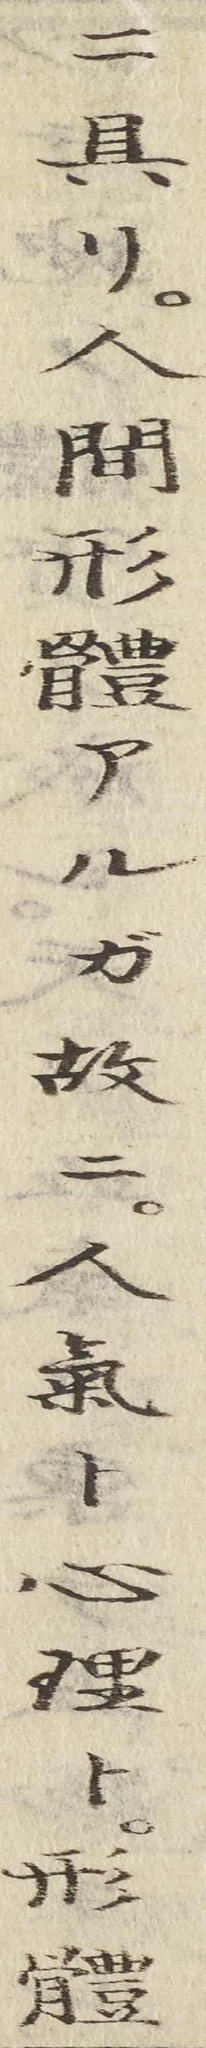ニ具リ。人間形体アルガ故ニ。人気ト心理ト。形体
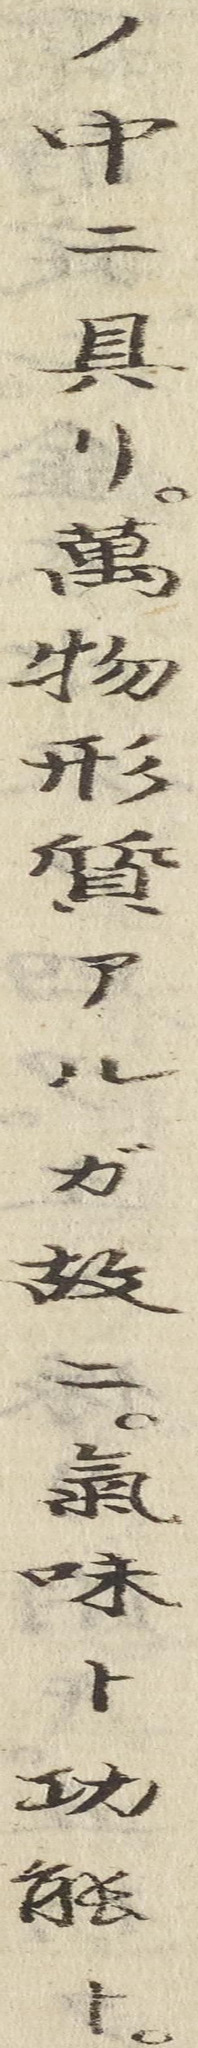ノ中ニ具リ。万物形質アルガ故ニ。気味ト功能ト。
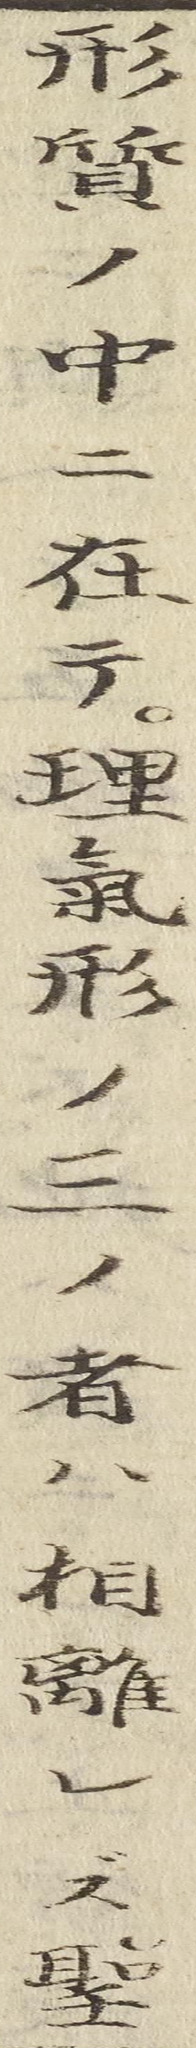形質ノ中ニ在テ。理気形ノ三ノ者ハ相離レズ。聖
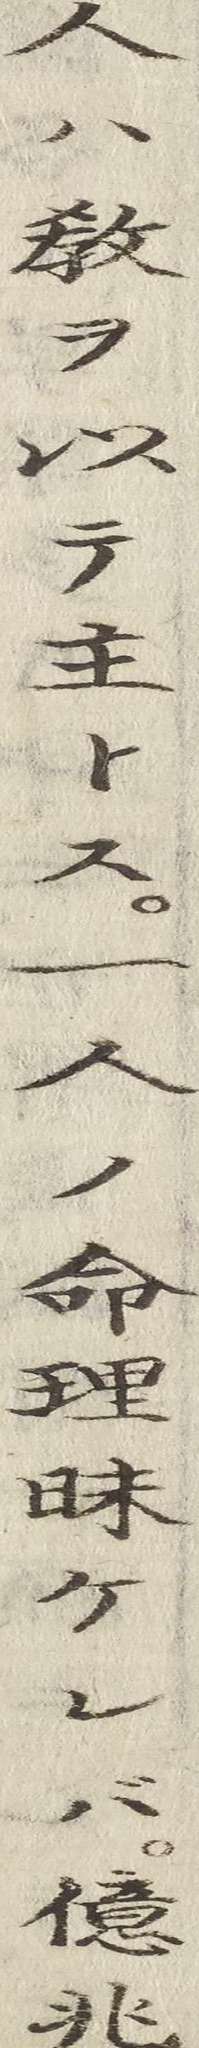人ハ教ヲ以テ主トス。一人ノ命理昧ケレバ。億兆
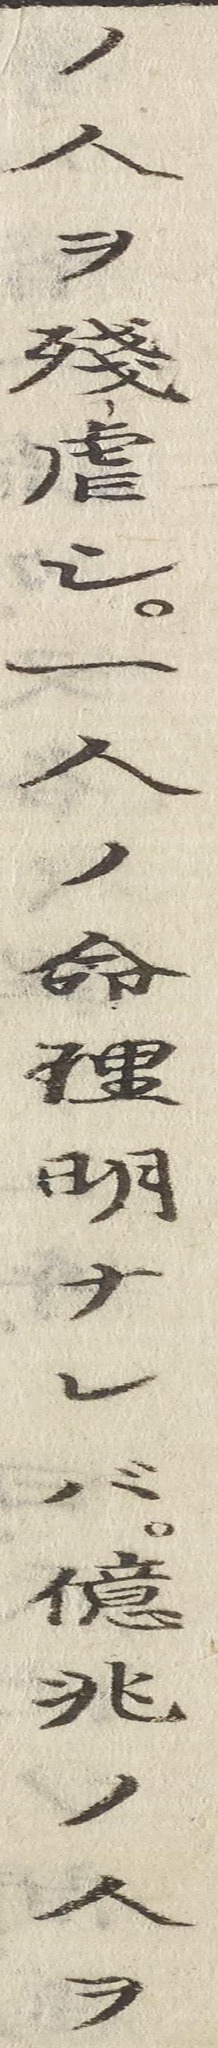ノ人ヲ残虐シ。一人ノ命理明ナレバ。億兆ノ人ヲ
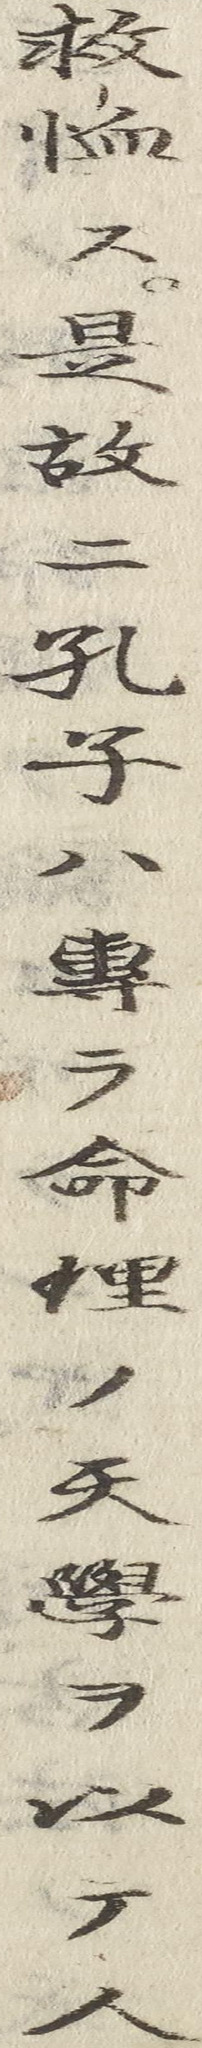救恤ス。是故ニ孔子ハ専ラ命理ノ天学ヲ以テ人
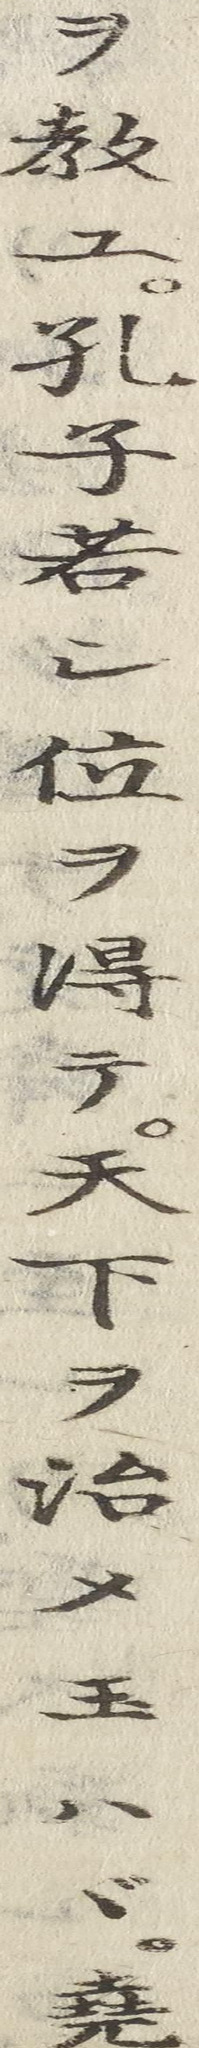ヲ教エ。孔子若シ位ヲ得テ。天下ヲ治メ玉ハヾ。堯
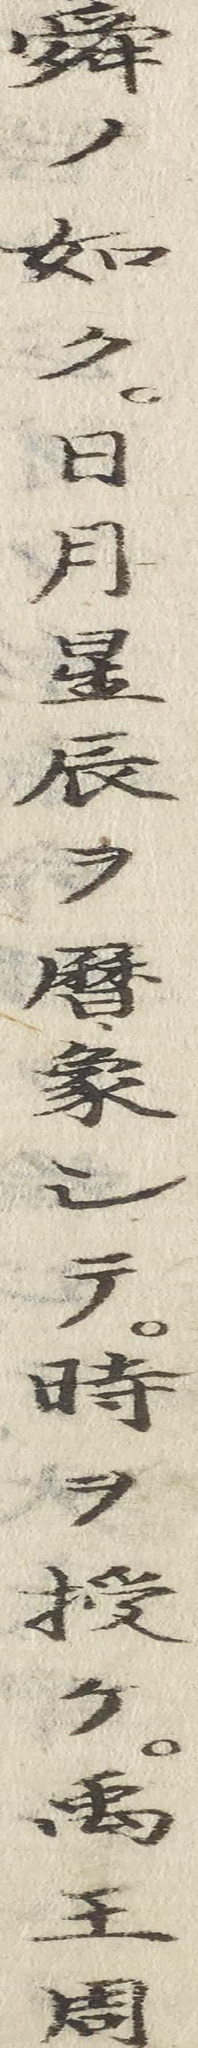舜ノ如ク。日月星辰ヲ暦象シテ。時ヲ授ケ。禹王周
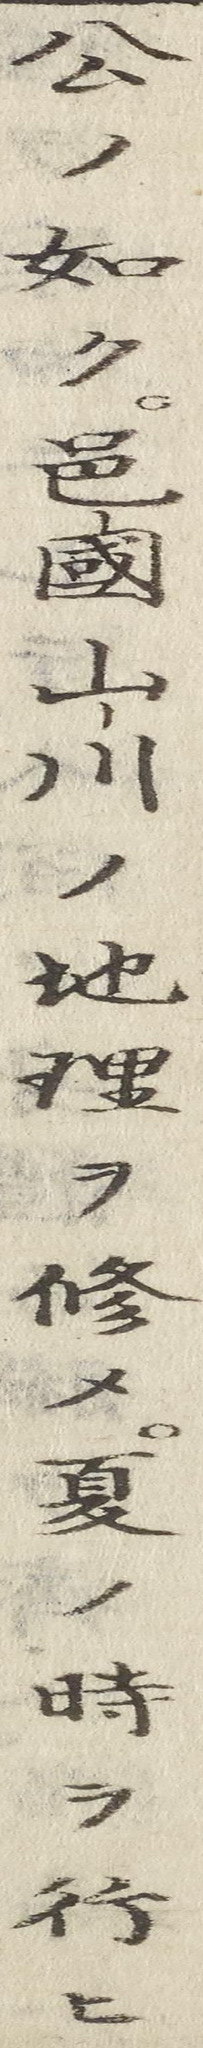公ノ如ク。邑国山川ノ地理ヲ修メ。夏ノ時ヲ行ヒ
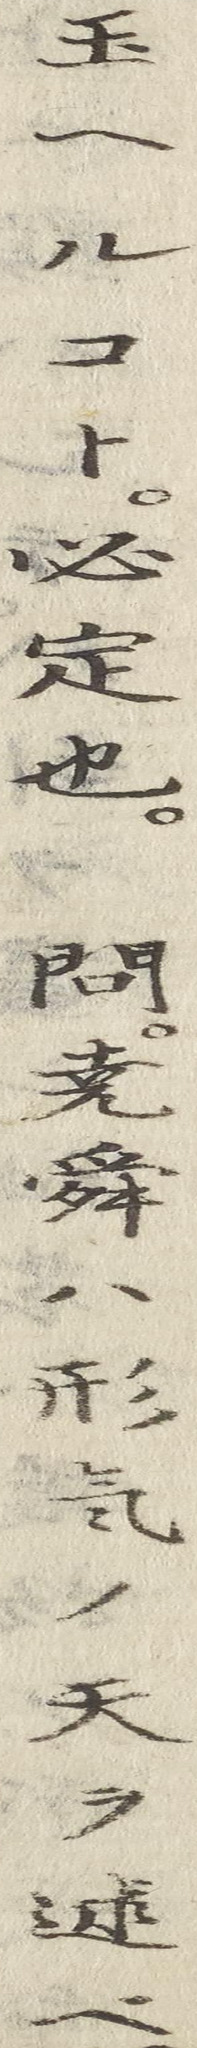玉ヘルコト。必定也。問。堯舜ハ形気ノ天ヲ述ベ。
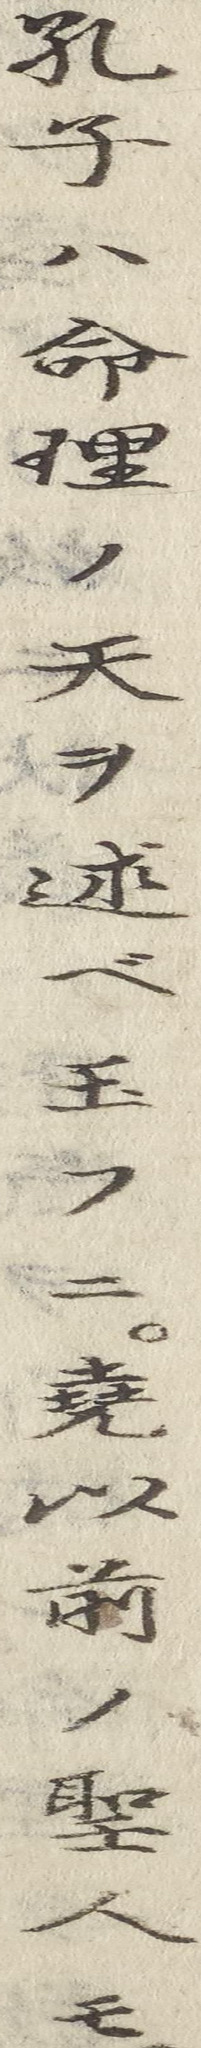孔子ハ命理ノ天ヲ述ベ玉フニ。堯以前ノ聖人モ。
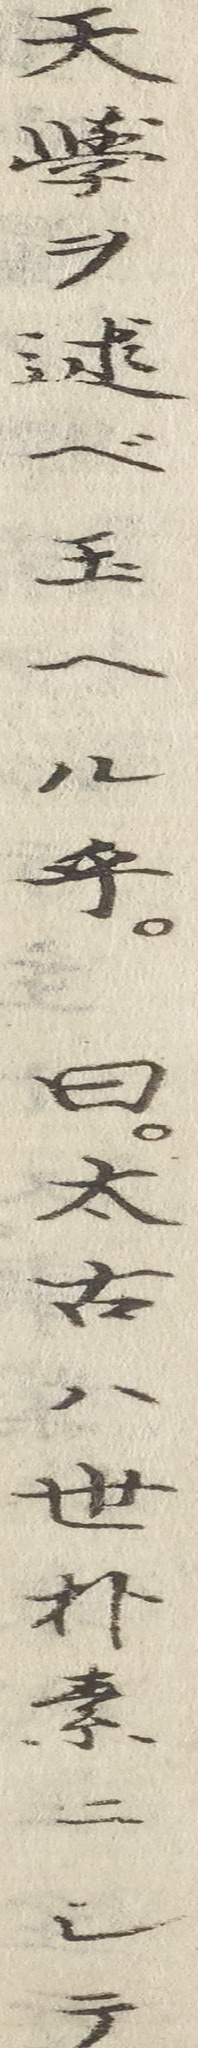天学ヲ述ベ玉ヘル乎。曰。太古ハ世朴素ニシテ
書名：大略天学名目鈔　天經或問附録
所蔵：東京大学地震研究所図書室 Earthquake Research Institute Library, The University of Tokyo, JAPAN
